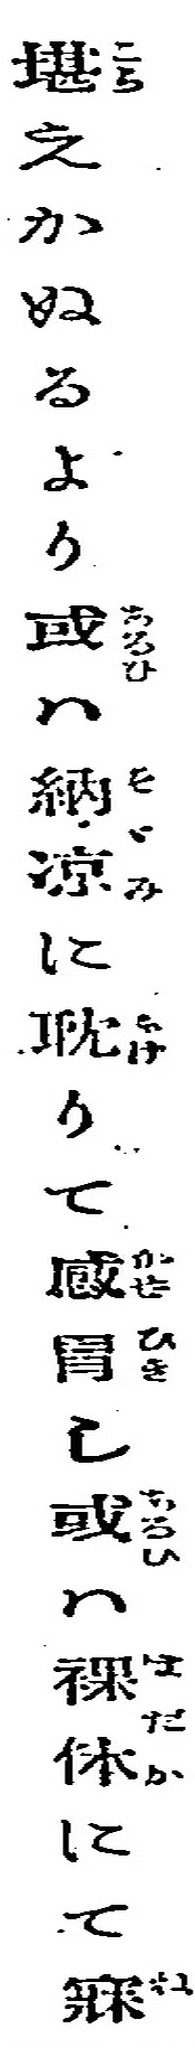堪えかぬるより或は納涼に耽りて感冒し或は裸体にて寝
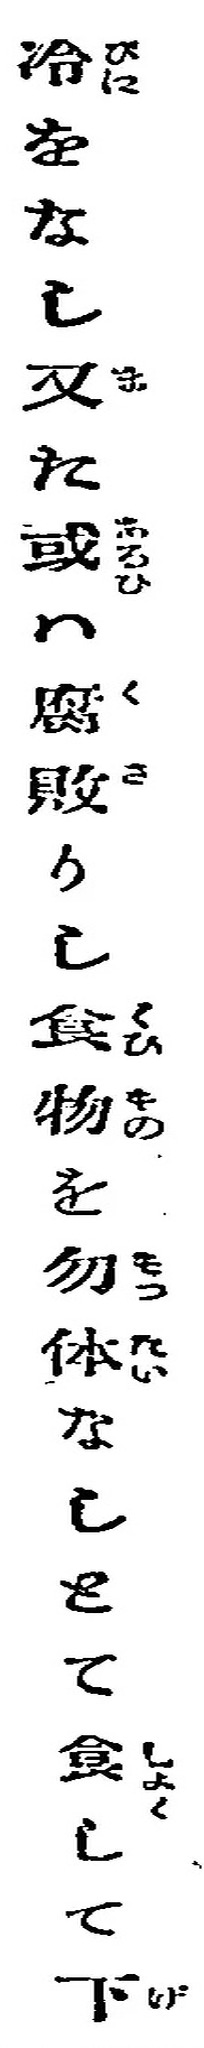冷をなし又た或は腐敗りし食物を勿体なしとて食して下
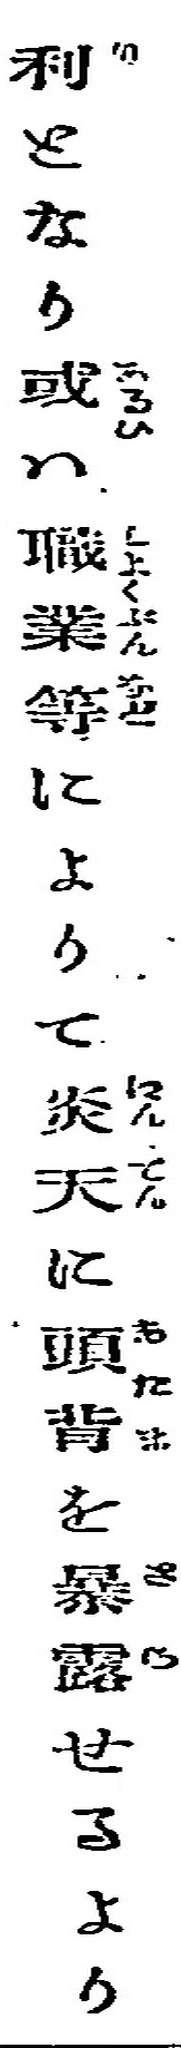利となり或は職業等によりて炎天に頭背を暴露せるより
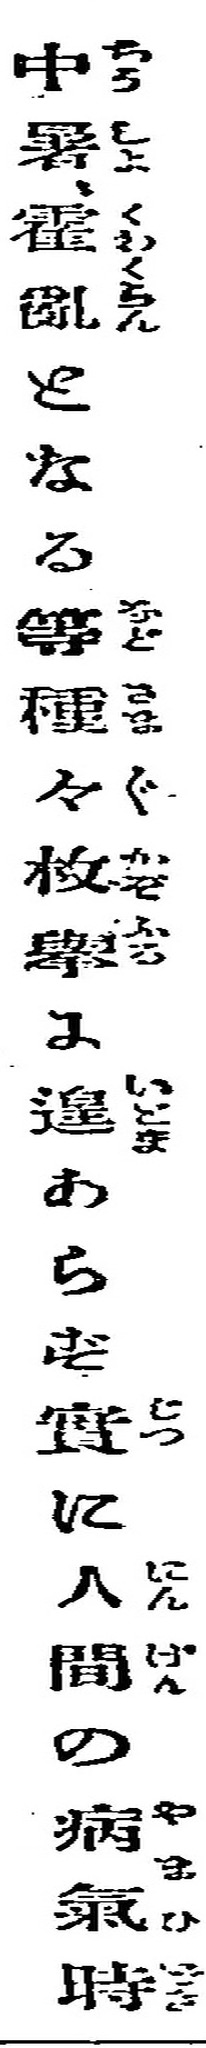中暑、霍亂となる等種々枚擧に遑あらず實に人間の病気時
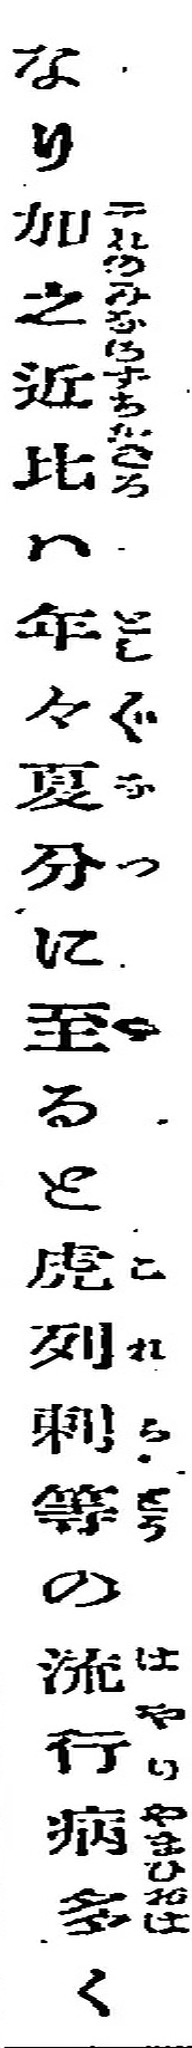なり加之近比は年々夏分に至ると虎列刺等の流行病多く

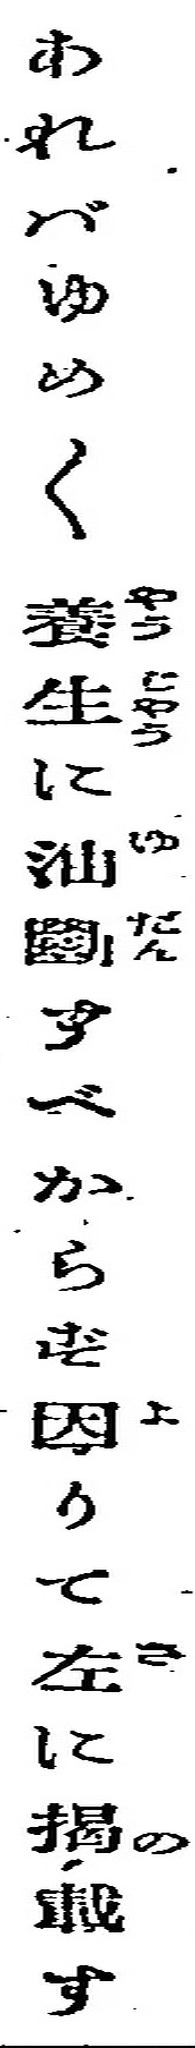あればゆめ〳〵養生に油断すべからず因りて左に掲載す
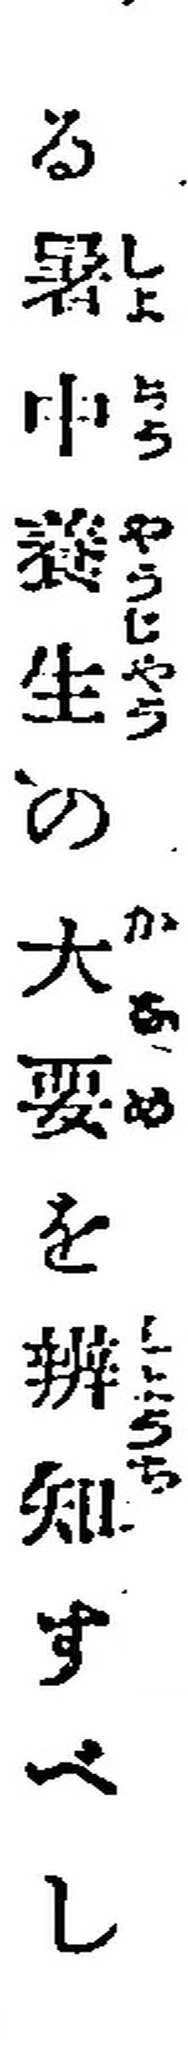る暑中養生の大要を辨知すべし
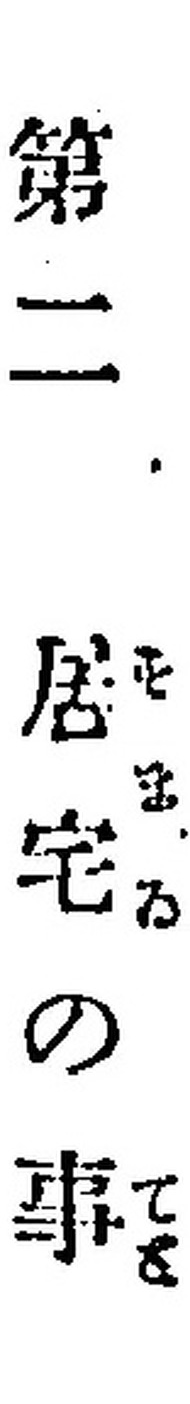第二居宅の事
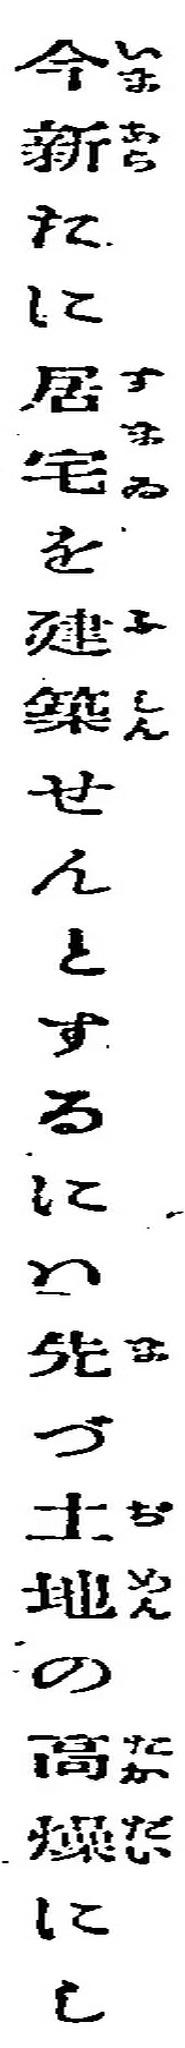今新たんい居宅を建築せんとするには先づ土地の高燥にし
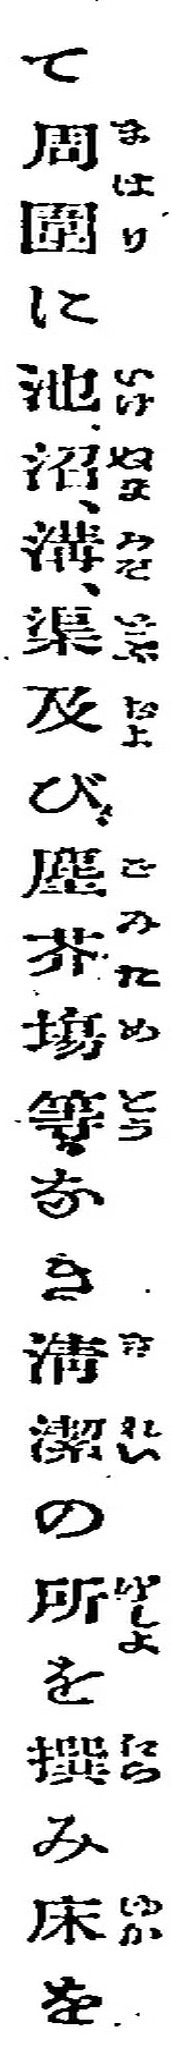て周囲に池、沼、溝、渠及び塵芥場等なき清潔の所を撰み床を
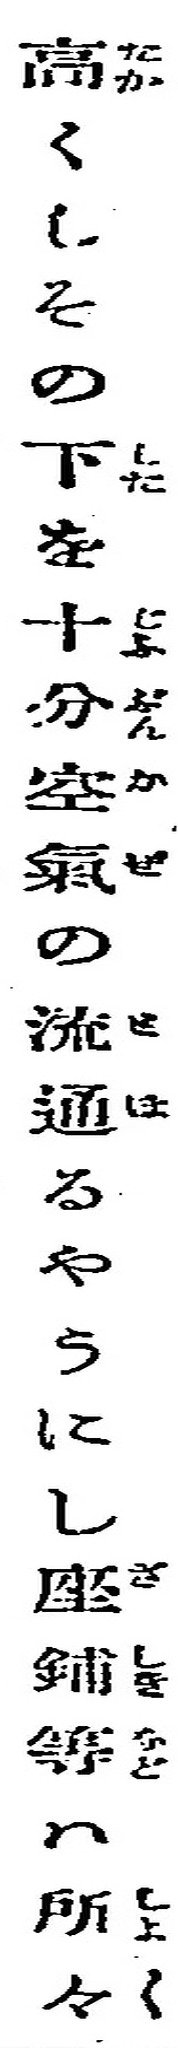高くしその下を十分空気の流通るやうにし座鋪等は所々
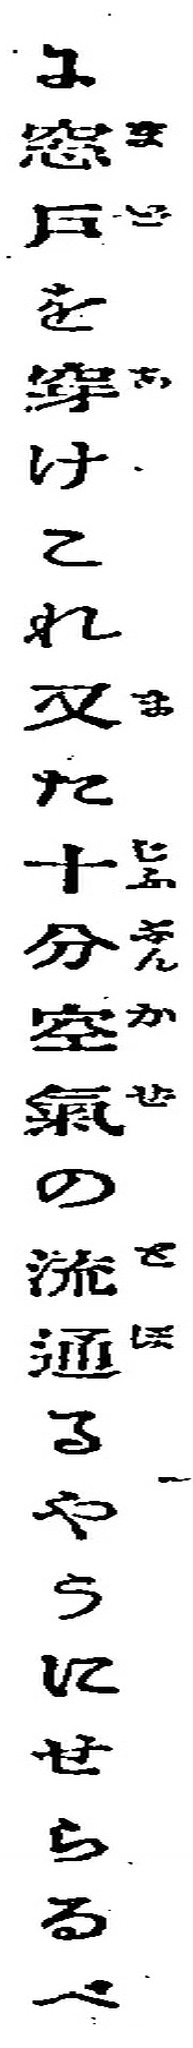に窓戸を穿けこれ又た十分空気の流通るやうにせらるべ
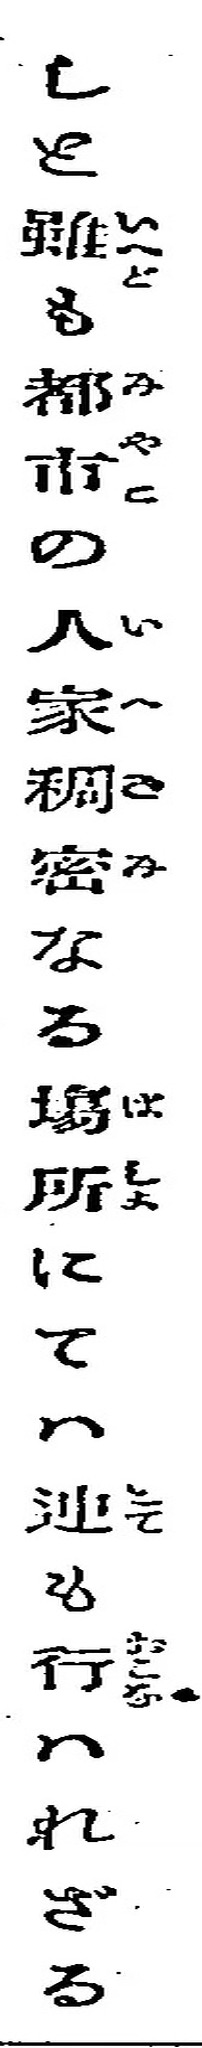しと雖も都市の人家稠密なる場所にては迚も行はれざる
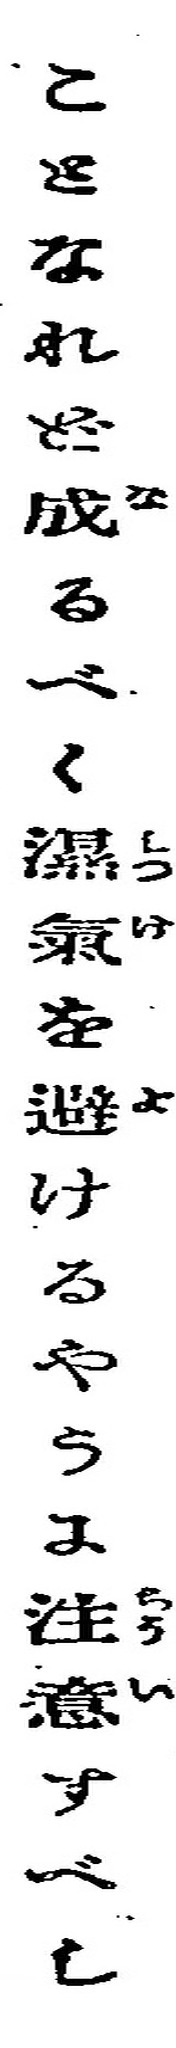ことなれど成るべく湿気を避けるやうに注意すべし
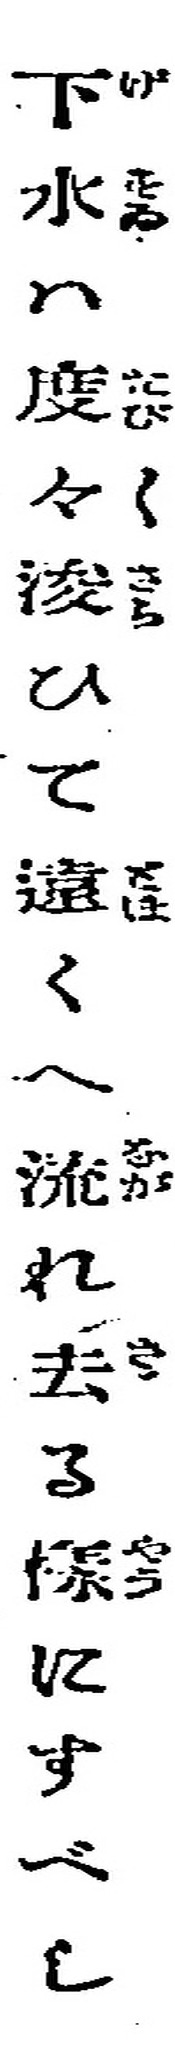下水は度々浚ひて遠くへ流れ去る様にすべし
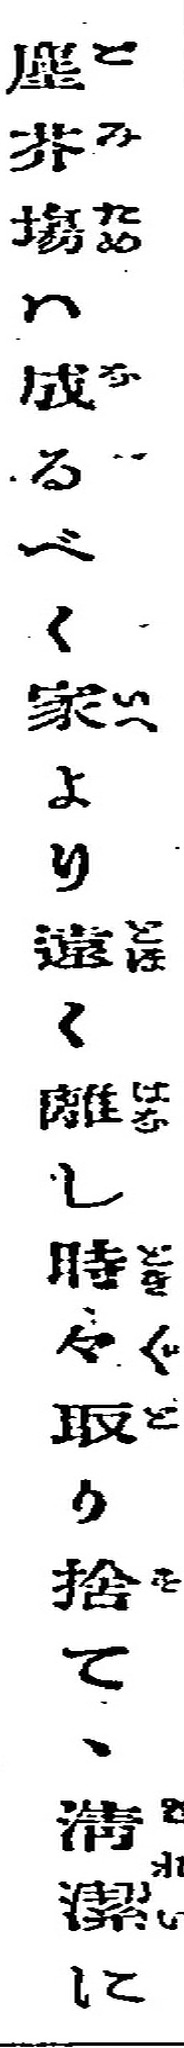塵芥場は成るべく家より遠く離し時々取り捨てゝ清潔に
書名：新撰暑中養生法 : 附・コレラ予防歌
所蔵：国立国会図書館 National Diet Library, JAPAN
